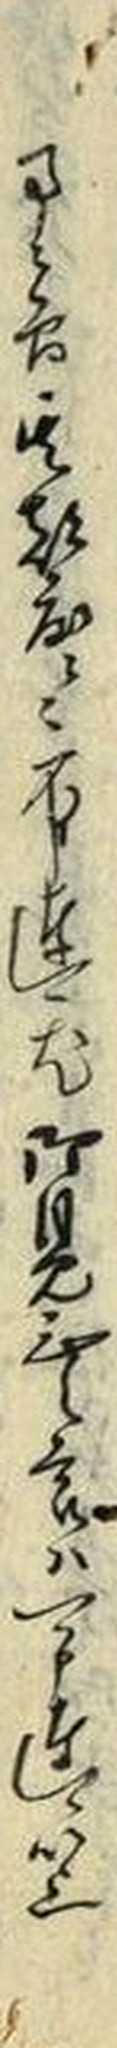事ニ候間其都度〃〃不申達候尤御目見無之節ハ可申達候以上
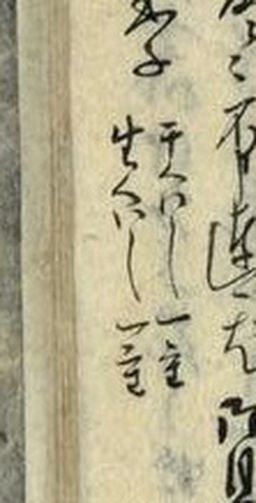生くハし一重
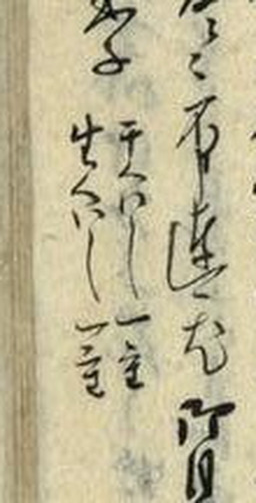生くハし一重

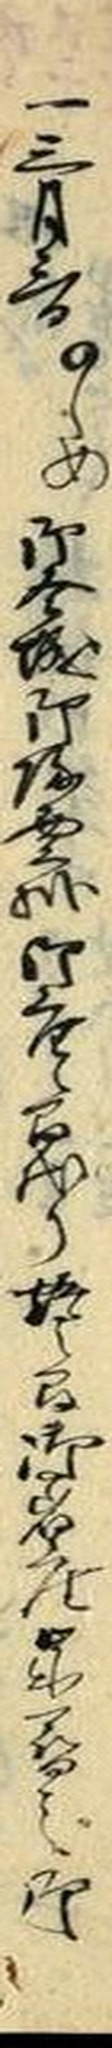一三月三日のしめ御登城御帰殿掛御座之間代り鶴之間御着座歳暮之御
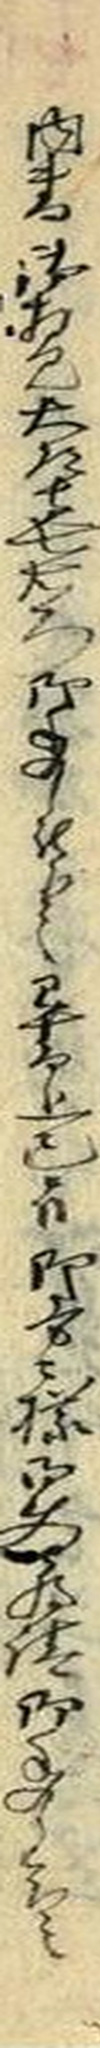内書御拝見大道寺七右衛門御手のし被下之畢而上巳ニ付御方々様御使被為請御手のし被下之
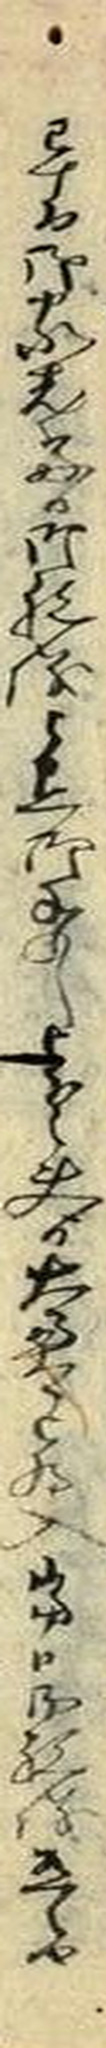畢而御家老当日之御祝儀被申上御手のし被下之夫ゟ大奥へ被為入当日御祝儀有候由
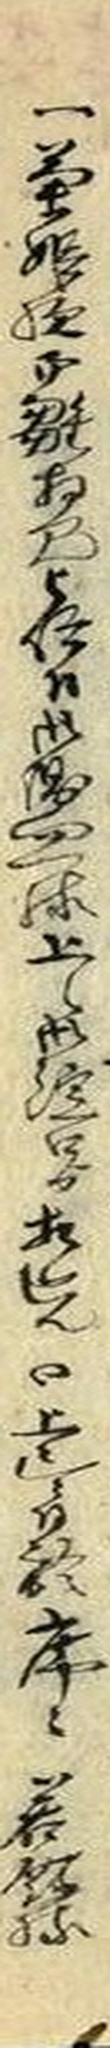一菊姫様御雛拝見被仰付候御側向一統上之御錠口ゟ相廻ㇽ〇上巳ニ付於席々若殿様
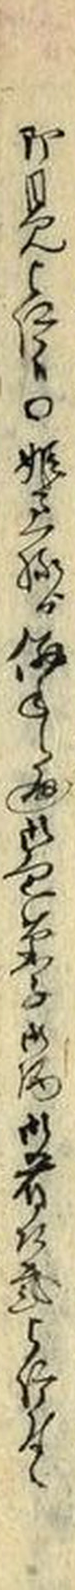御目見被仰付候〇姫君様ゟ例年之通御包菓子御酒御肴頂戴被仰付候
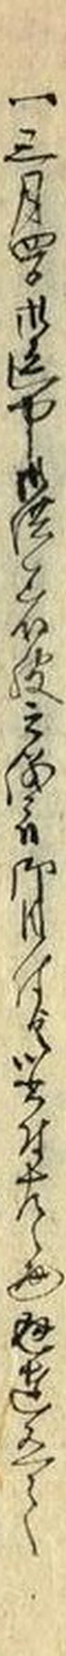一三月四日御道中御供着服之儀ニ付御目付ゟ以書付左之通通達有之
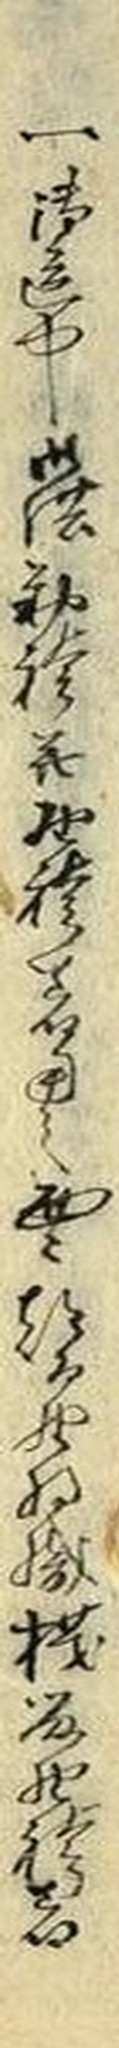一御道中御供勤絝并野絝着用之面々都而野羽織桟留野絝着
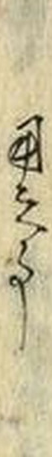用之事
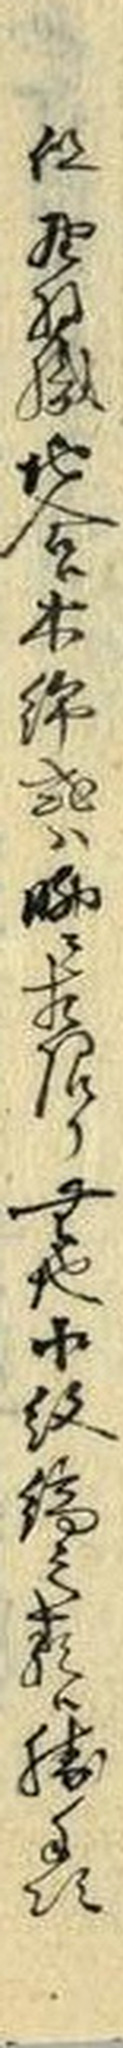但野羽織地合ハ木綿或ハ晒ニ相限り無地小紋縞之類ハ勝手次
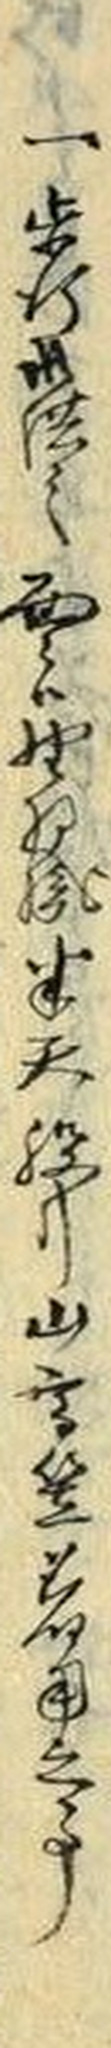一歩行御供之面々ハ羽織半天股引山高笠着用之事
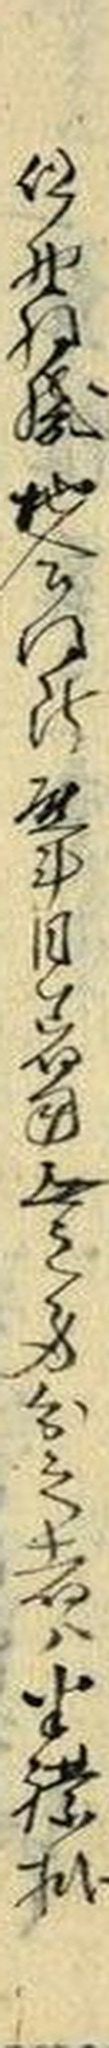但野羽織地合同断熨斗目着用無之身分之者ハ半襟掛
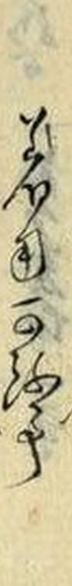着用可致事
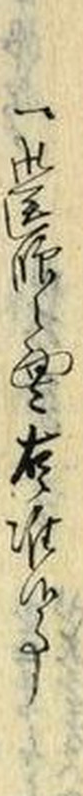一御医師之面々右ニ准候事
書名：少傅日録抄（斉承付側向頭取日記、在府）
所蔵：福井県文書館 Fukui Prefectural Archives
